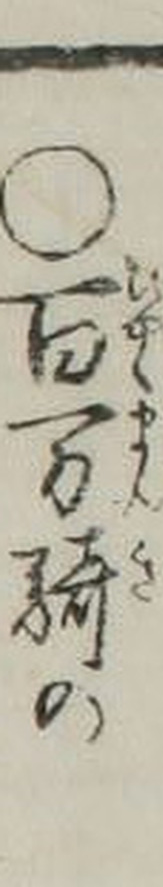○百万騎の
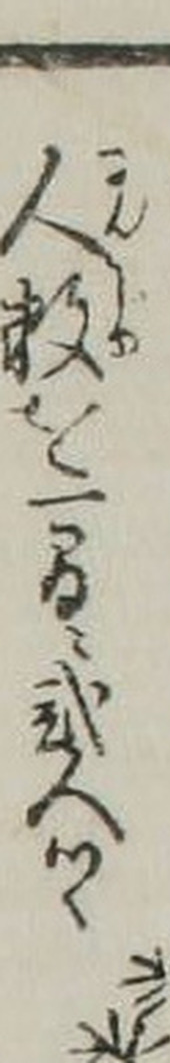人数を一間に弐人つゝ
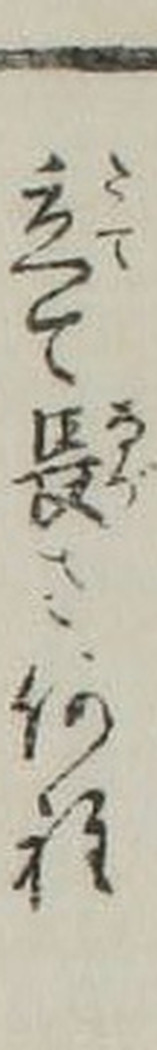立て長さ何程
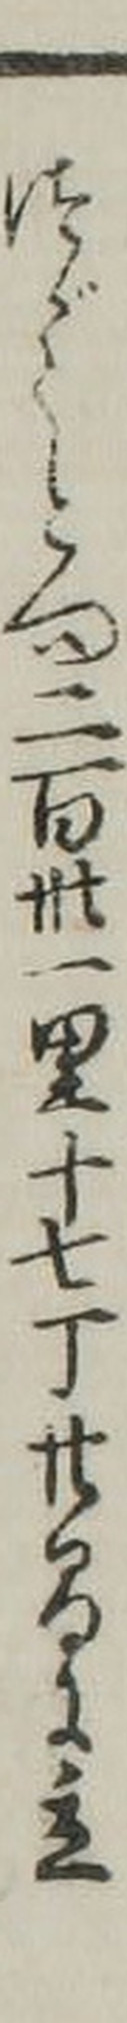つゞくと問二百卅一里十七丁廿間に立
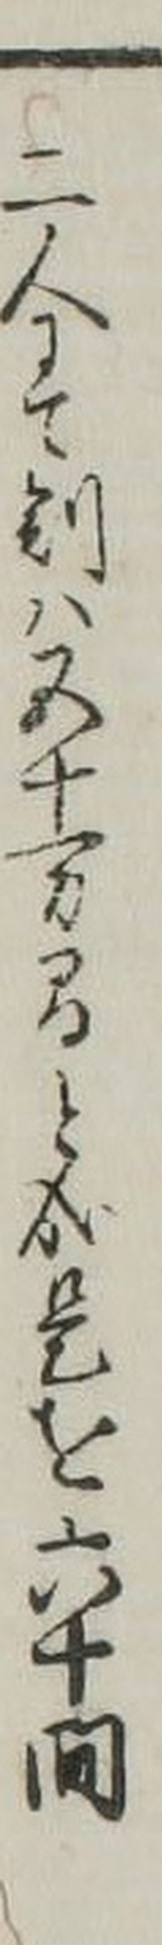二人にて割は五十万間と成是を六十間
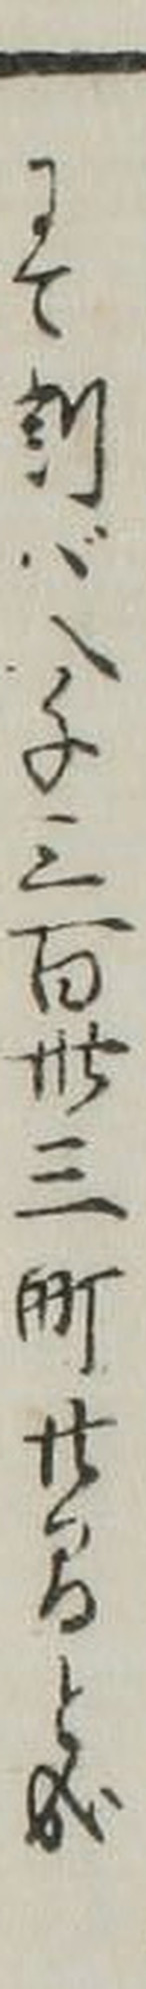にて割ば八千三百卅三町廿間と成
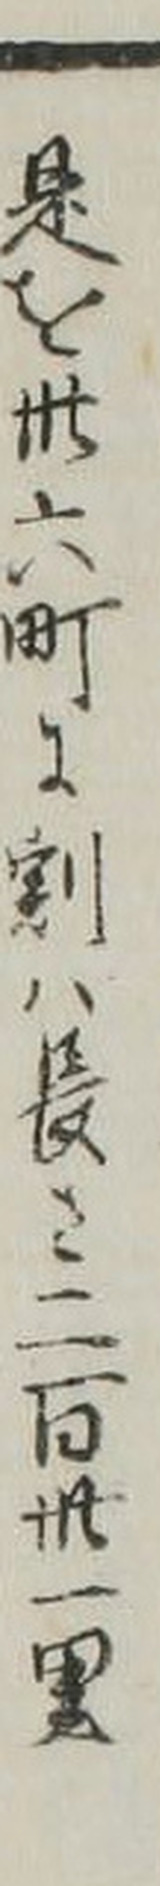是を卅六町に割は長さ二百卅一里
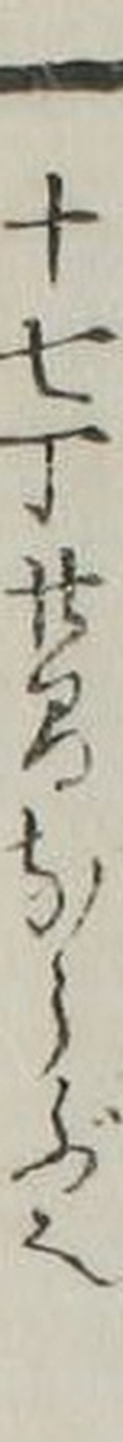十七丁廿間ならぶ也
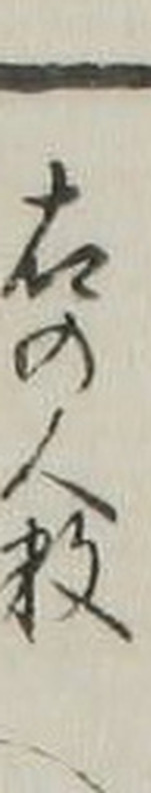右の人数
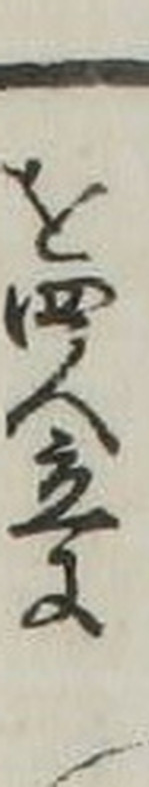を四人立に
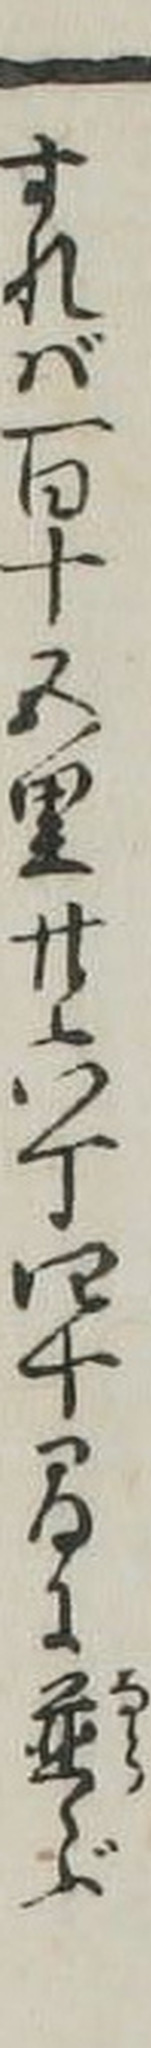すれば百十五里厘廿六丁四十間に並ぶ
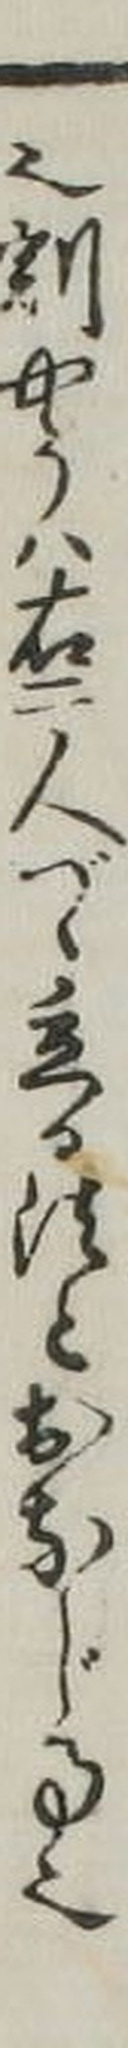也割やうは右二人づゝ立る法とおなじ事也
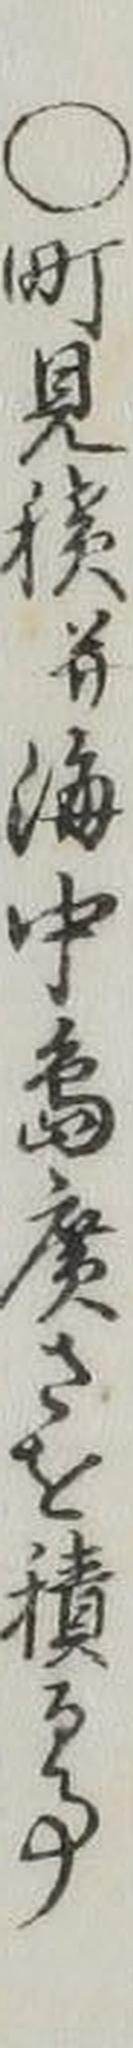○町見積并海中島広さを積る事
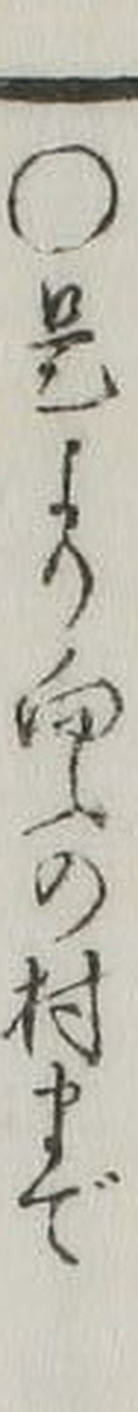○是より向ふの村まで
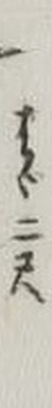はゞ二尺
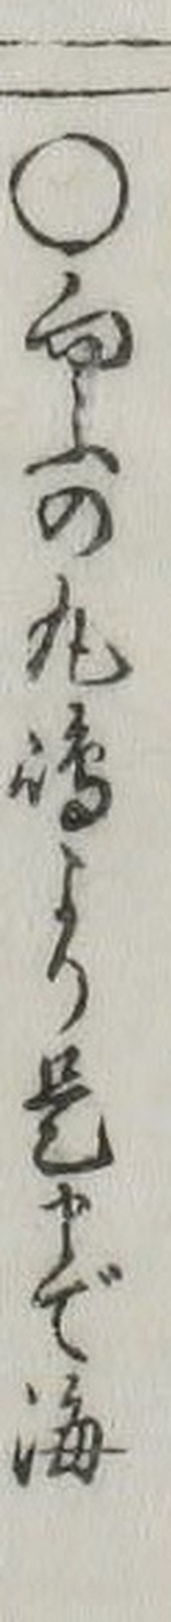○向ふの丸島より是まで海
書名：宝玉塵劫記
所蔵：東京学芸大学教育コンテンツアーカイブ
